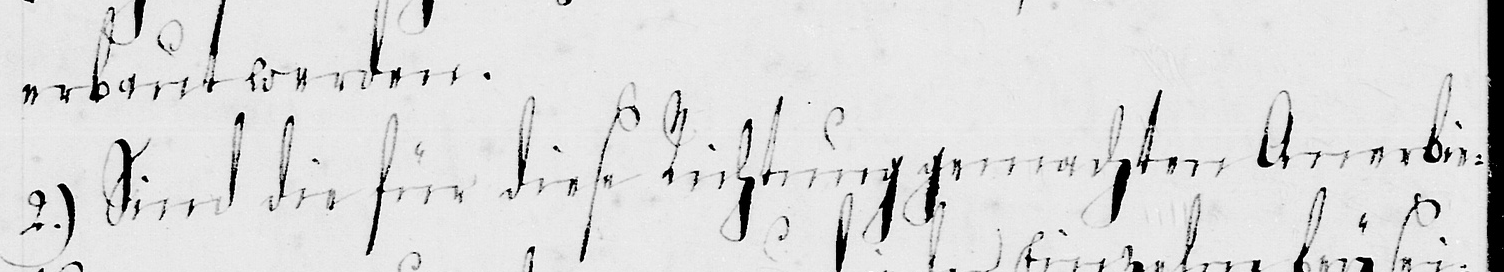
2.) Sind die für diese Richtung gemachten Anerbie¬
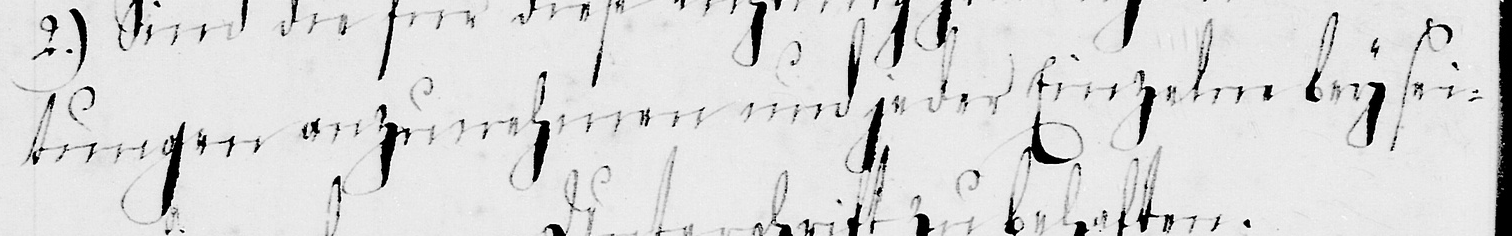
tungen anzunehmen und jeder Einzelne bey sei¬
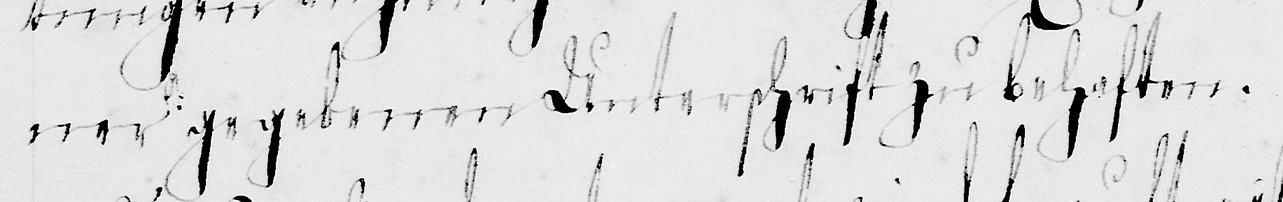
ner gegebenen Unterschrift zu behaften.
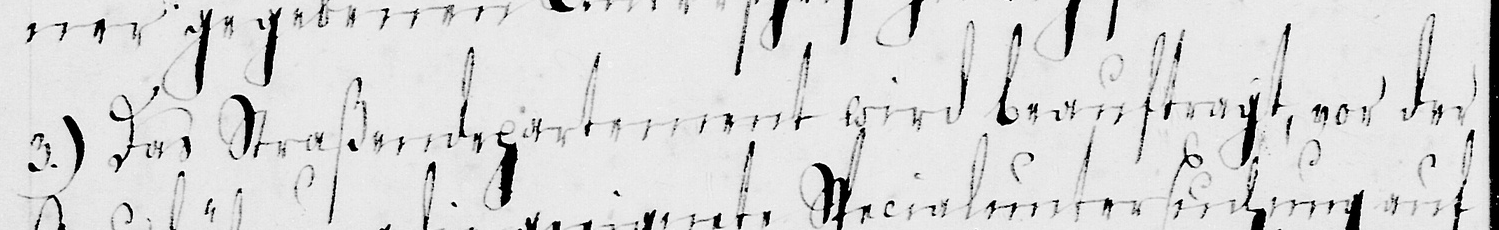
3.) Das Straßendepartement wird beauftragt, vor der
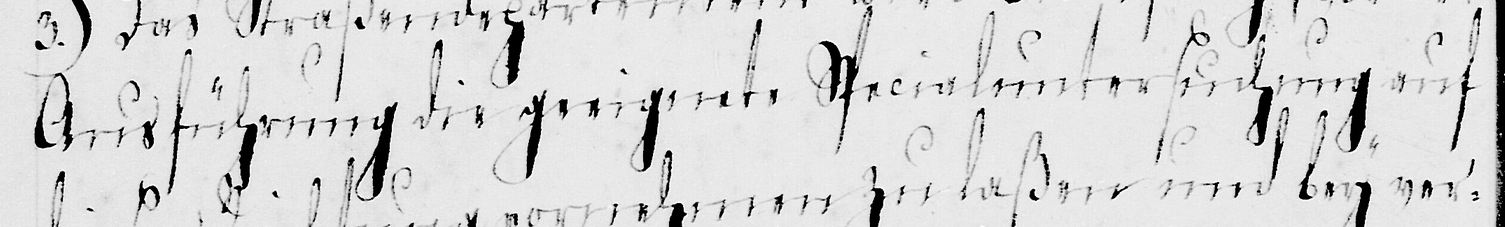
Ausführung die geeignete Specialuntersuchung auf
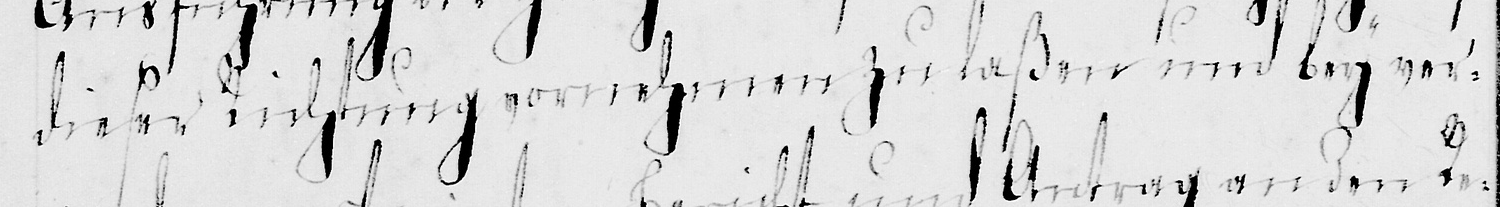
dieser Richtung vornehmen zu laßen und bey ver¬
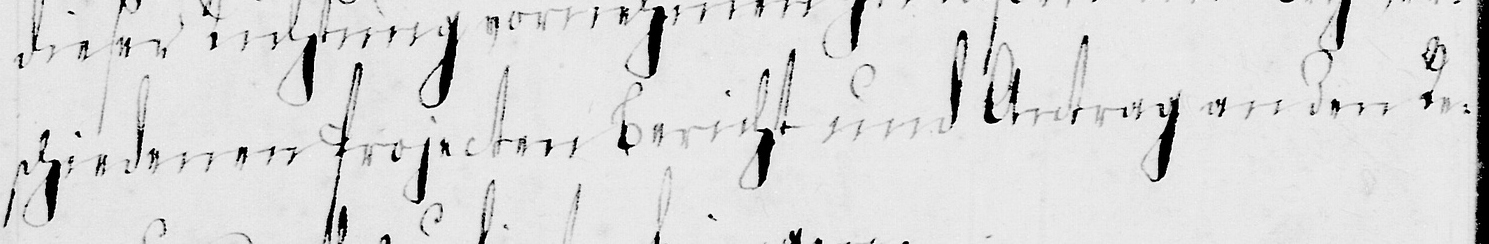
schiedenen Projecten Bericht und Antrag an den Re¬
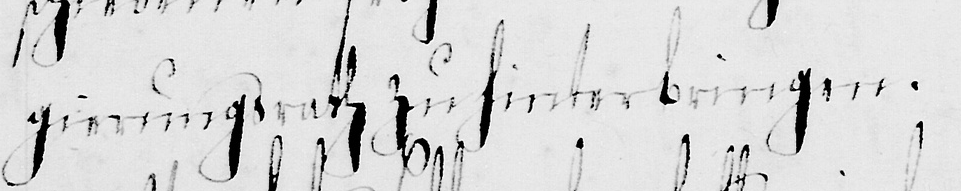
gierungsrath zu hinterbringen.
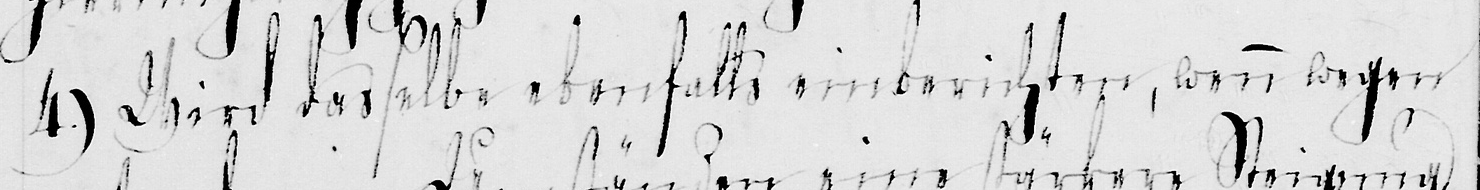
4.) Wird dasselbe ebenfalls einberichten, wenn wegen
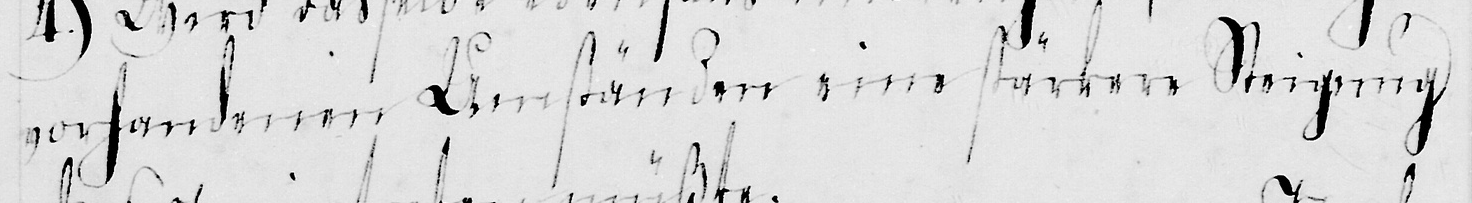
vorhandenen Umständen eine stärkere Steigung
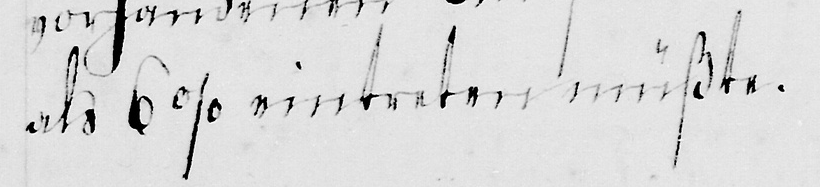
als 6% eintreten müßte.
